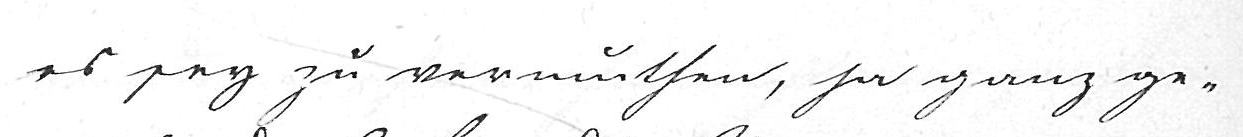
es sey zu vermuthen, ja ganz ge-
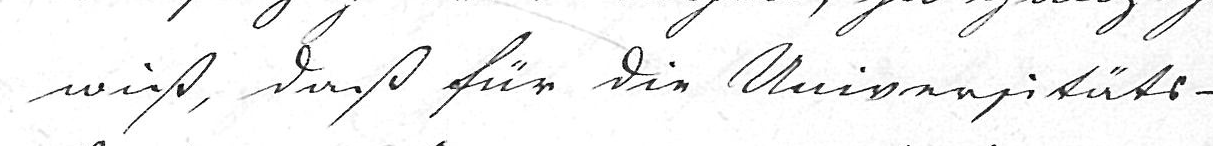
wiß, daß für die Universitäts-
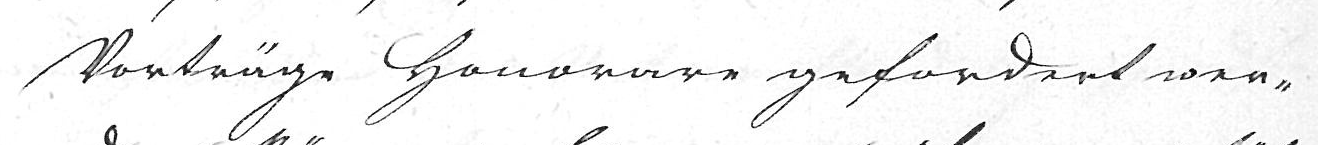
Vorträge Honorare gefordert wer-
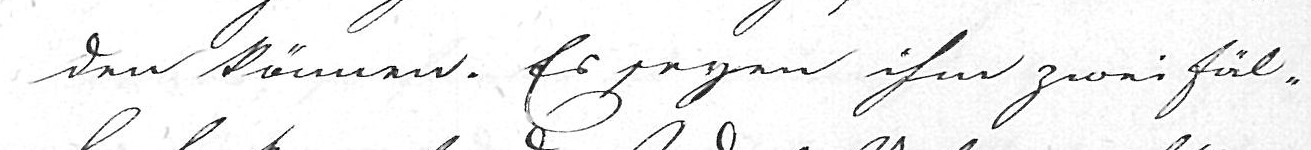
den können. Es seyen ihm zwei Fäl-
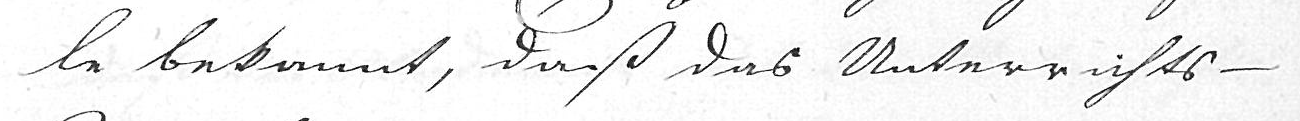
le bekannt, daß das Unterrichts-
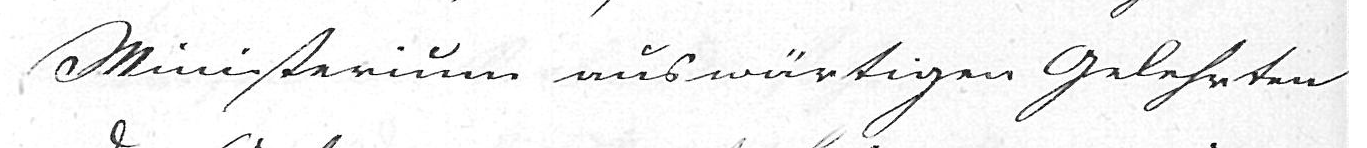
Ministerium auswärtigen Gelehrten
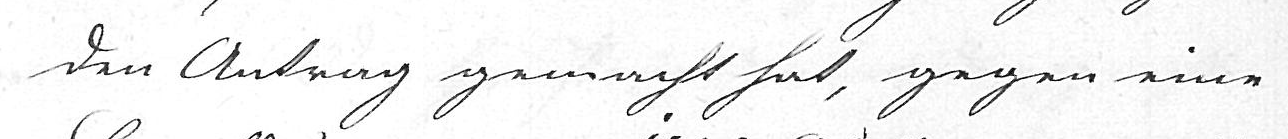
den Antrag gemacht hat, gegen eine
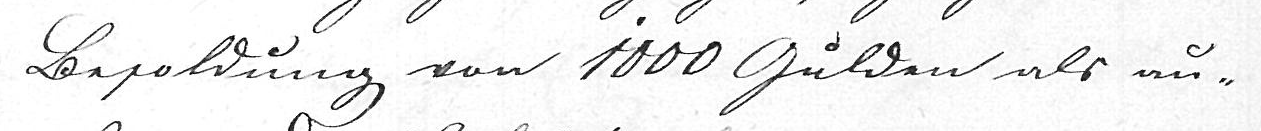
Besoldung von 1000 Gulden als au-
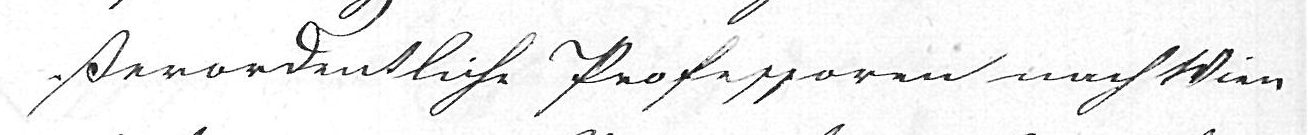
ßerordentliche Professoren nach Wien
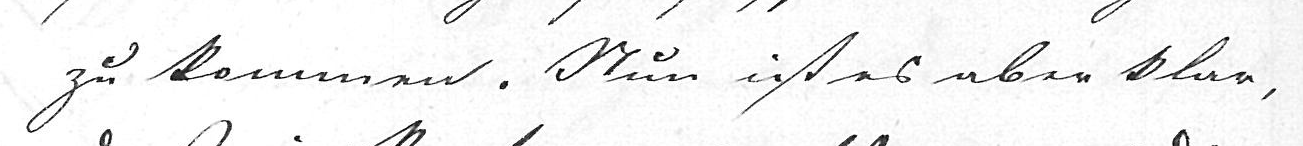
zu kommen. Nun ist es aber klar,
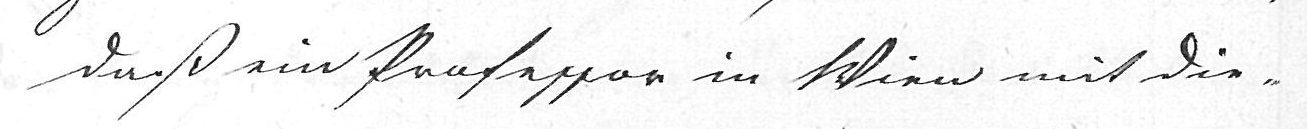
daß ein Professor in Wien mit die-
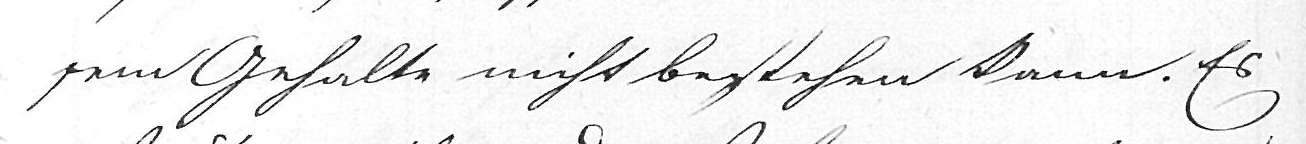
sem Gehalte nicht bestehen kann. Es
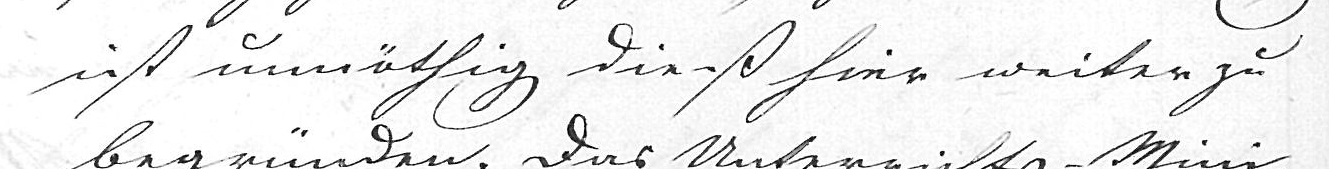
ist unnöthig dieß hier weiter zu
